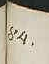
84.
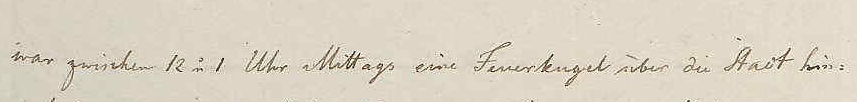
war zwischen 12 u 1 Uhr Mittags eine Feuerkugel über die Stadt hin-
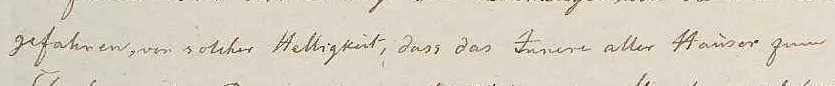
gefahren, von solcher Helligkeit, dass das Innere aller Häuser zum
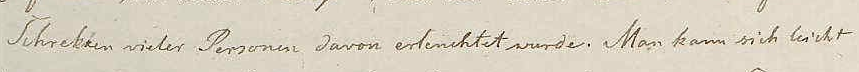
Schrekken vieler Personen davon erleuchtet wurde. Man kann sich leicht
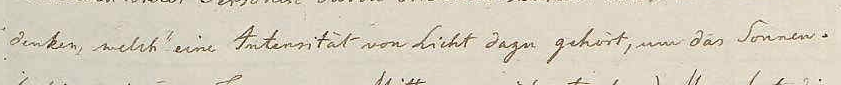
denken, welch eine Intensität von Licht dazu gehört, um das Sonnen-
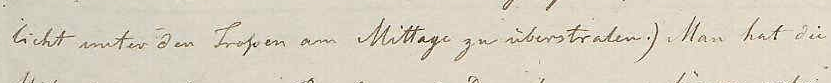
licht unter den Tropen am Mittage zu überstralen.) Man hat die
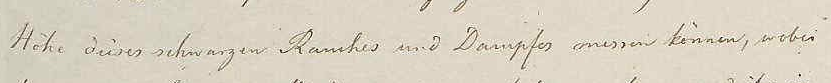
Höhe dieses schwarzen Rauches und Dampfes messen können, wobei
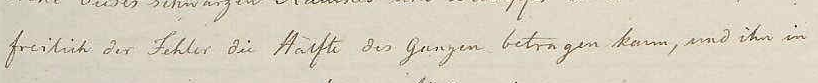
freilich der Fehler die Hälfte des Ganzen betragen kann, und ihn in
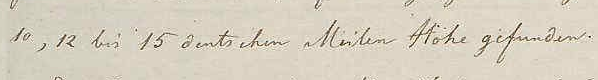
10, 12 bis 15 deutschen Meilen Höhe gefunden.
